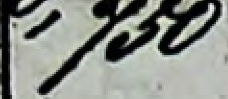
0,750
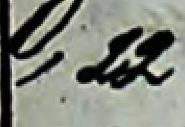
0,22
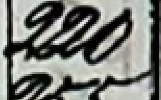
220
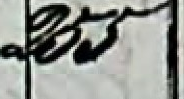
255
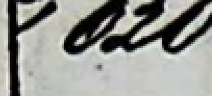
0,020
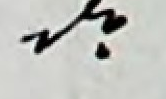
Do
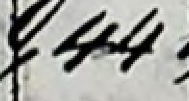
0,44
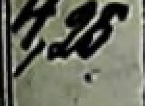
4,25
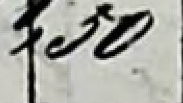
1,50
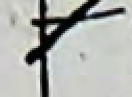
7
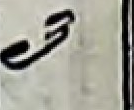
3
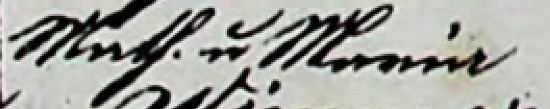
Math. u Maria
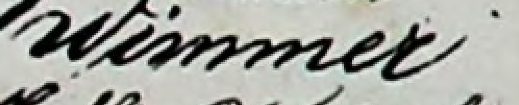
Wimmer
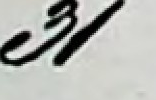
31
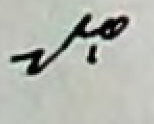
Do
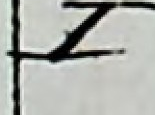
I
